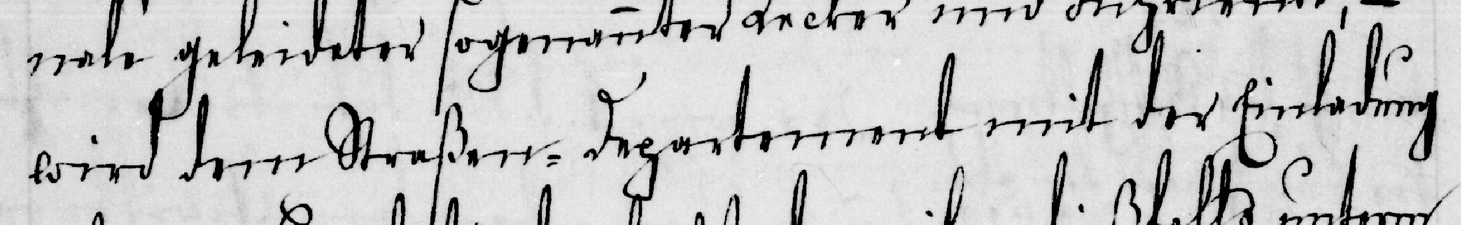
wird dem Straßen-Departement mit der Einladung
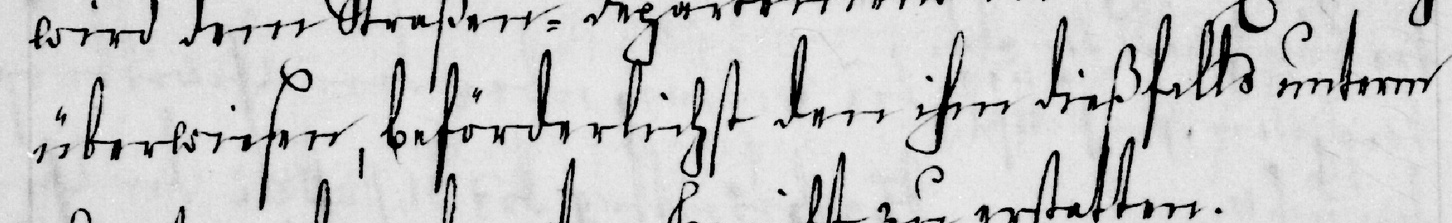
überwiesen, beförderlichst den ihm dießfalls unterm
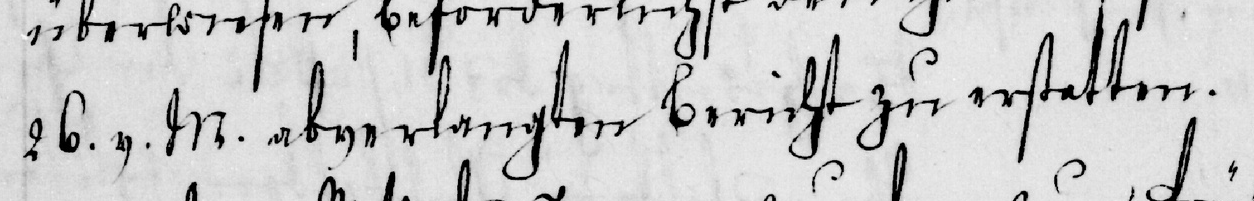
26. v. M. abverlangten Bericht zu erstatten.
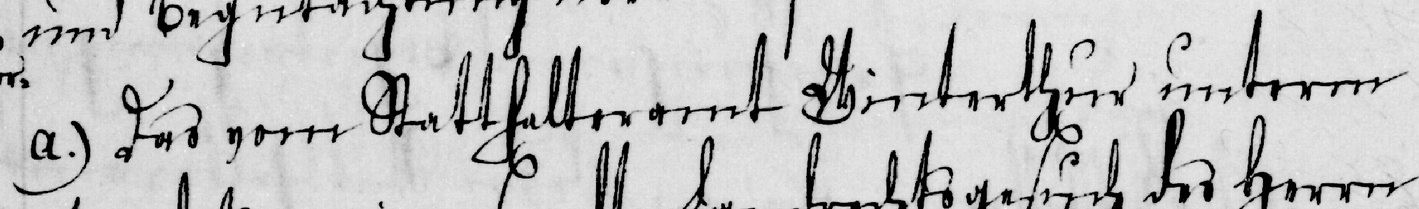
a.) Das vom Statthalteramt Winterthur unterm
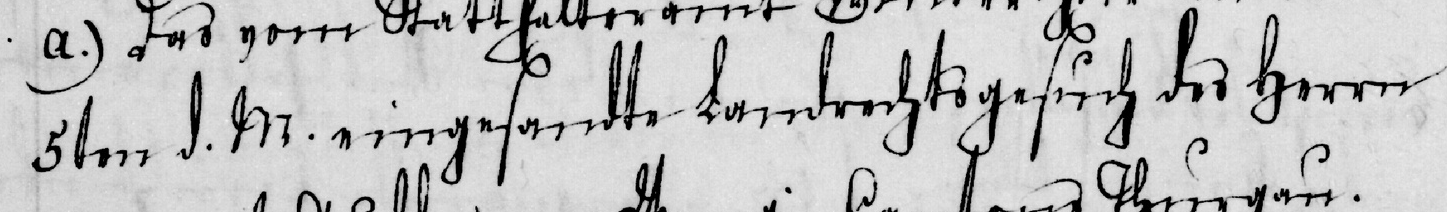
5ten d. M. eingesandte Landrechtsgesuch des Herrn
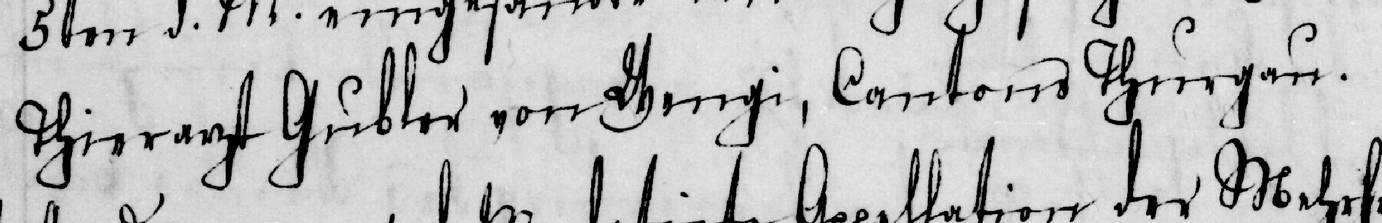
Thierarzt Gubler von Wengi, Cantons Thurgau.
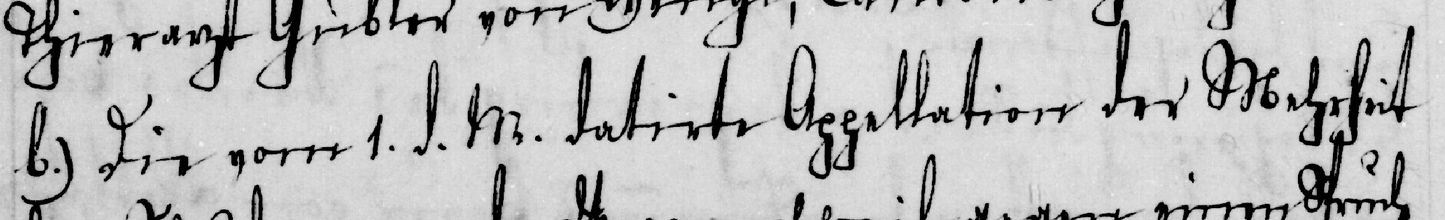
b.) Die vom 1. d. M. datirte Appellation der Mehrheit
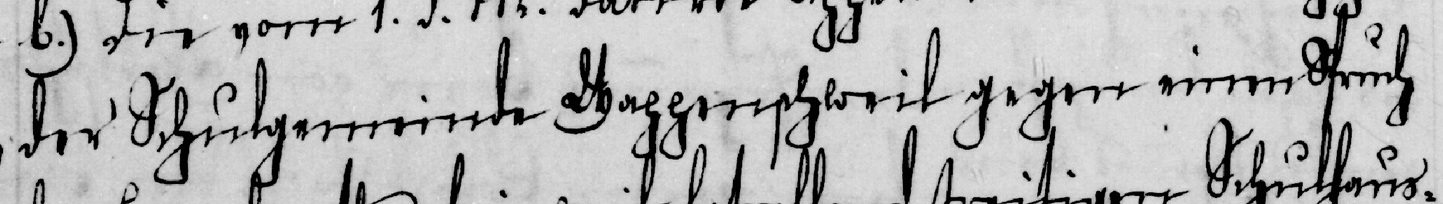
der Schulgemeinde Wappenschweil gegen einen Spruch
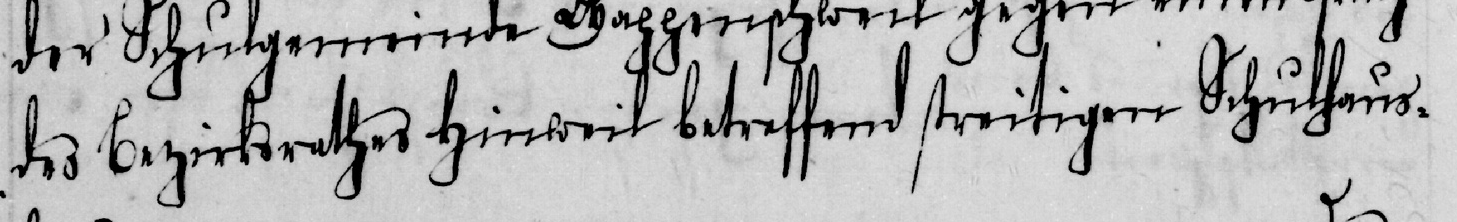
des Bezirksrathes Hinweil betreffend streitigen Schulhaus¬
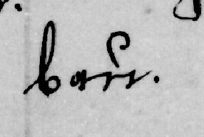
bau.
